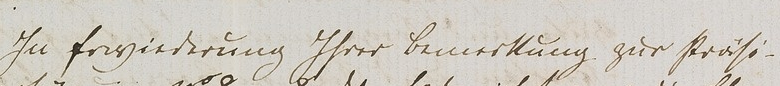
In Erwiederung Ihrer Bemerkung zur Präsi-
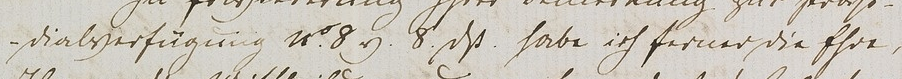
dialverfügung No 8. v. 8. dß. habe ich ferner die Ehre,
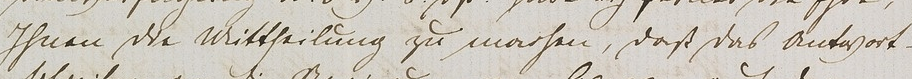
Ihnen die Mittheilung zu machen, daß das Antwort-
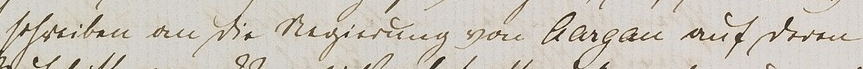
schreiben an die Regierung von Aargau auf deren
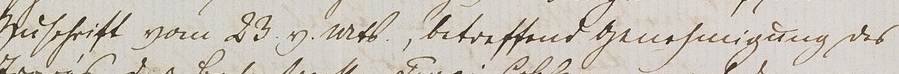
Zuschrift vom 23. v. Mts., betreffend Genehmigung des
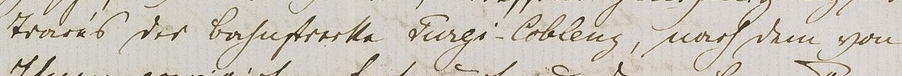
Tracés der Bahnstrecke Turgi–Coblenz, nach dem von
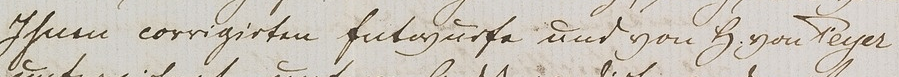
Ihnen corrigirten Entwurfe und von H. von Peyer
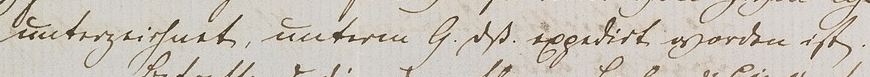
unterzeichnet, unterm 9. dß. expedirt worden ist.
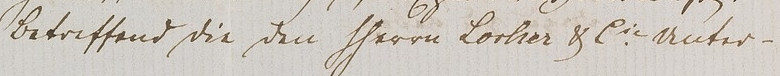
Betreffend die den Hherrn Locher & Cie Unter-
